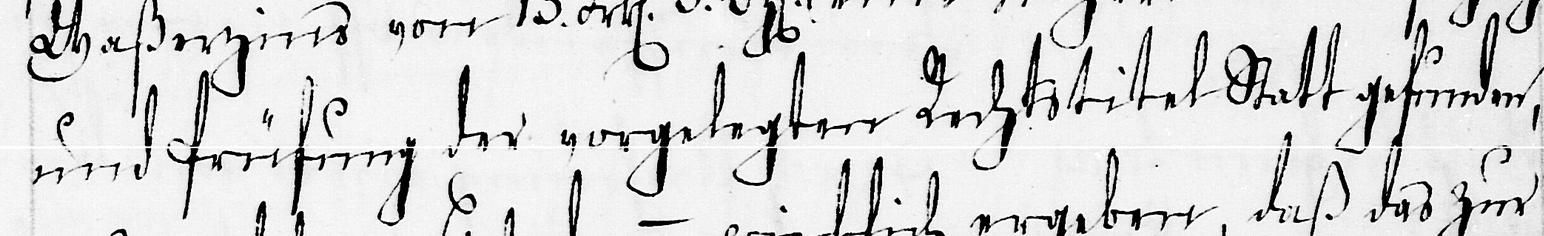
und Prüfung der vorgelegten Rechtstitel Statt gefunde¬
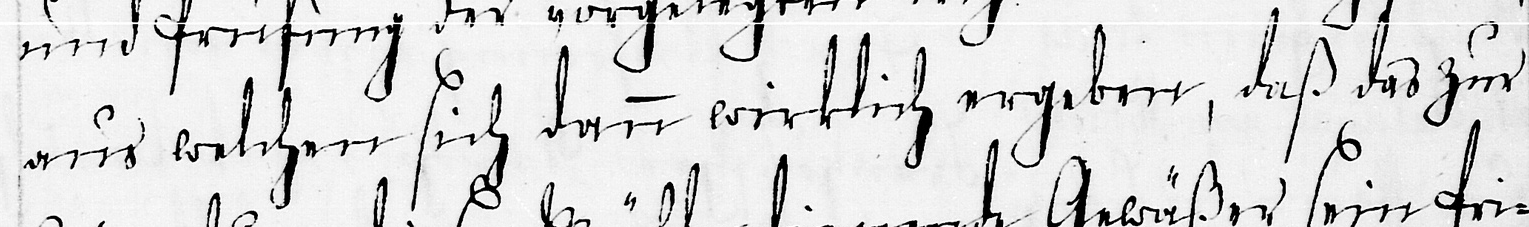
aus welchen sich dann wirklich ergeben, daß das zur
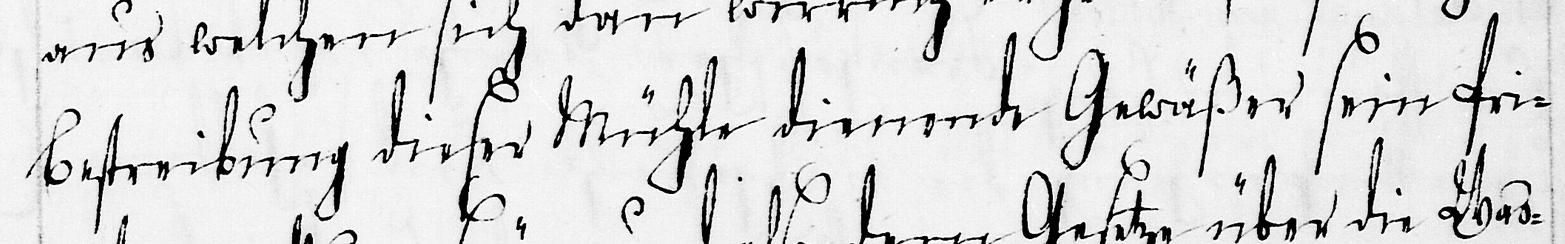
Betreibung] dieser Mühle dienende Gewäßer sein Pri¬
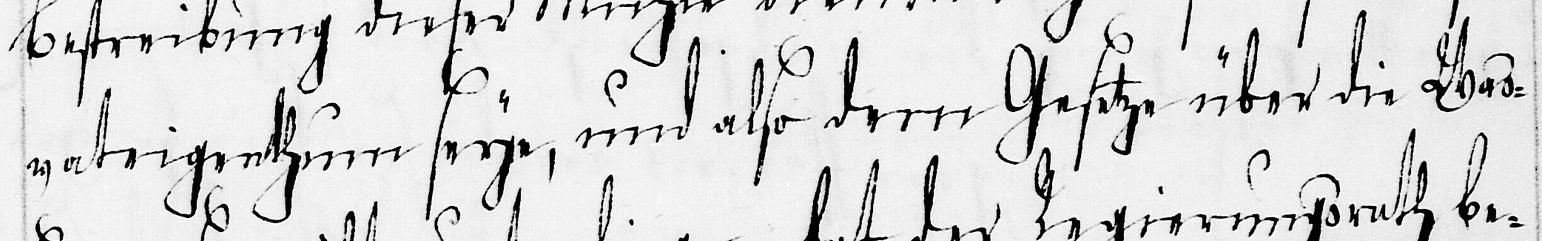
vateigenthum seye, und also dem Gesetze über die Waß¬
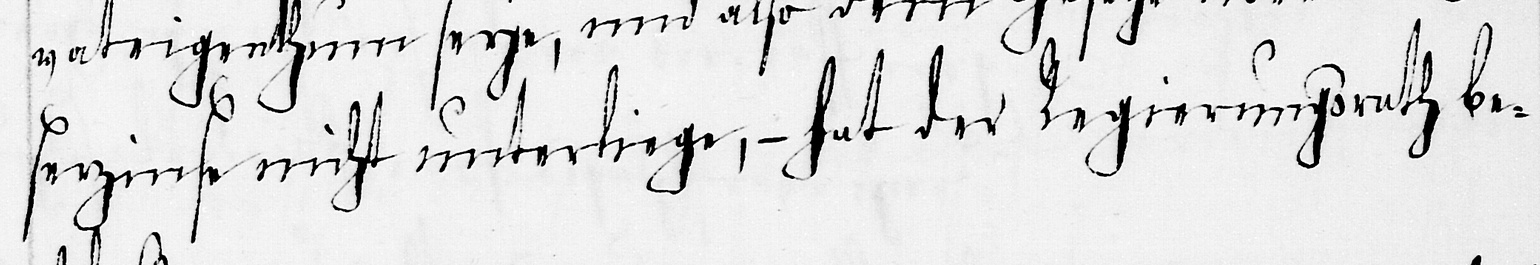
erzinse nicht unterliege, – hat der Regierungsrath be¬
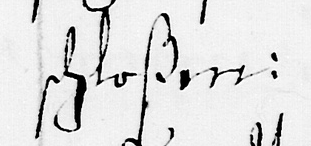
schloßen:
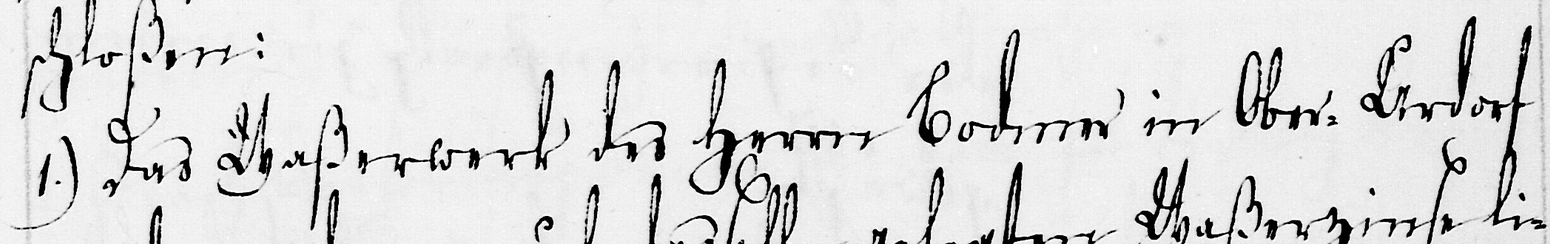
1.) Das Waßerwerk des Herrn Bodmer in Ober-Urdorf
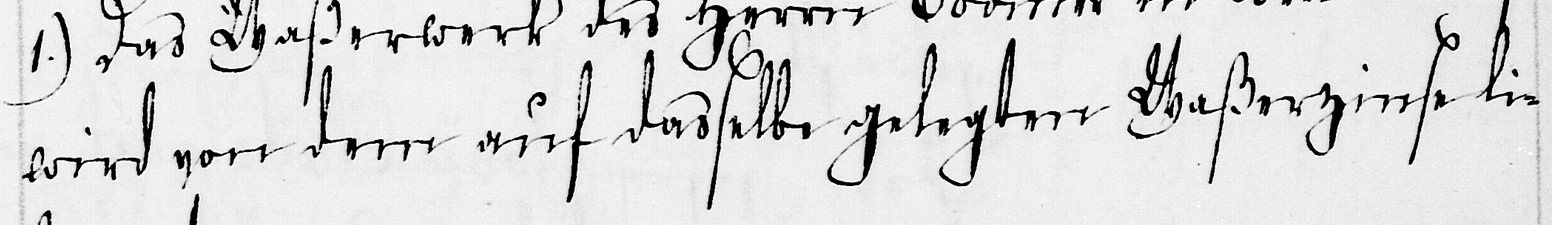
wird von dem auf dasselbe gelegten Waßerzinse li¬
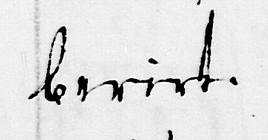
berirt.
